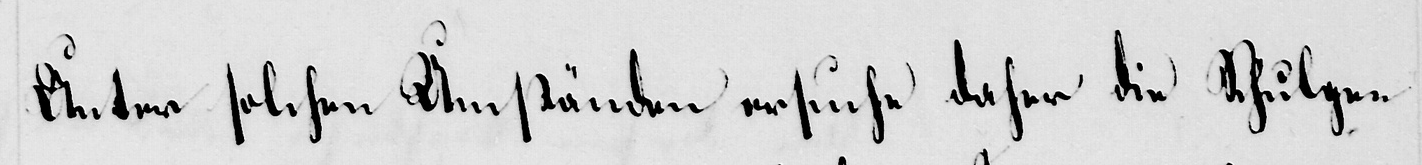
Unter solchen Umständen ersuche daher die Schulge¬
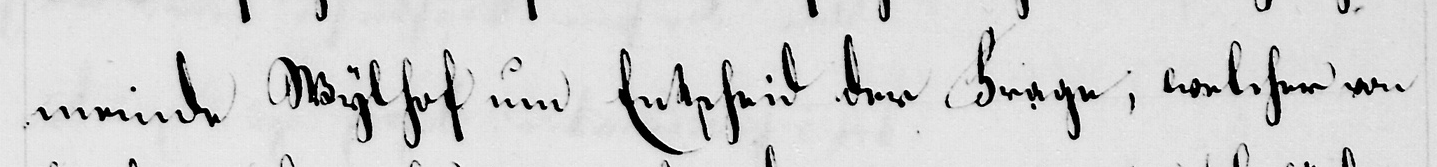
meinde Wylhof um Entscheid der Frage, welcher von
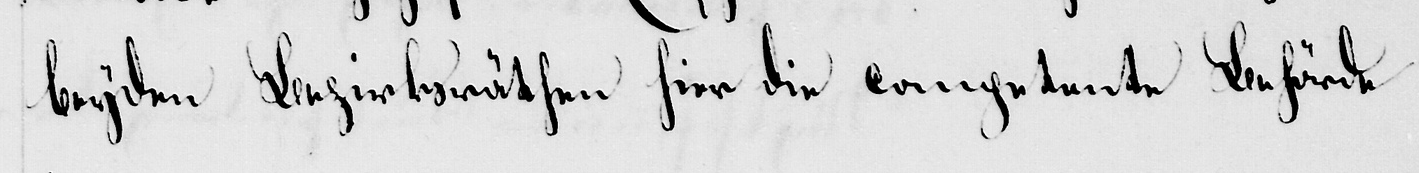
beyden Bezirksräthen hier die competente Behörde
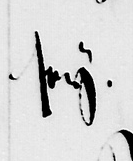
sey.
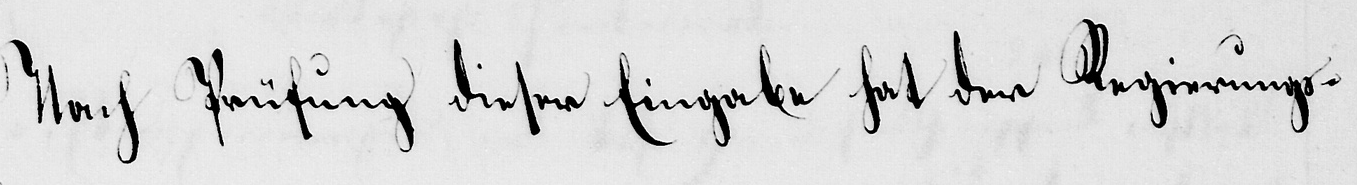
Nach Prüfung dieser Eingabe hat der Regierungs¬
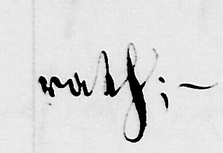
rath;
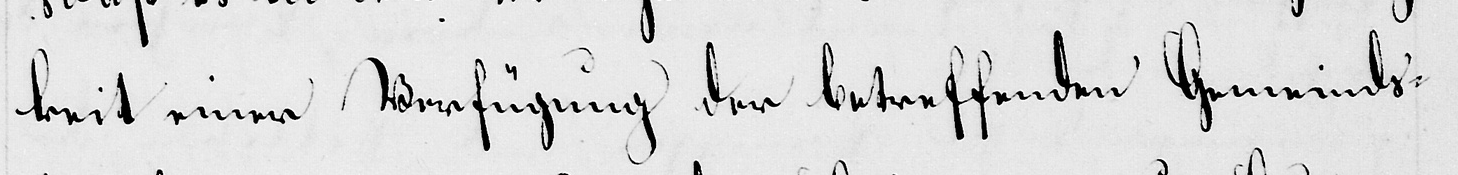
keit einer Verfügung der betreffenden Gemeinds¬
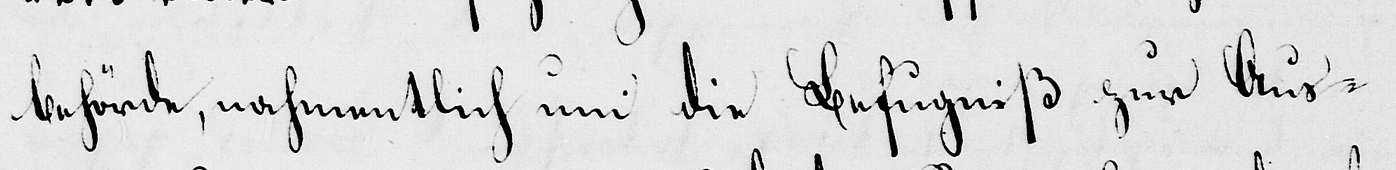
behörde, nahmentlich um die Befugniß zur Aus¬
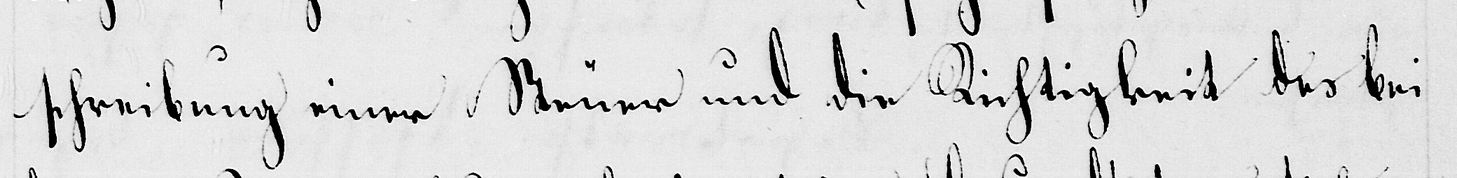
schreibung einer Steuer und die Richtigkeit des bei
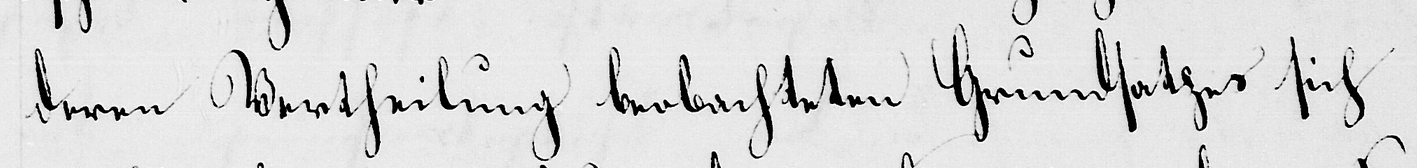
deren Vertheilung beobachteten Grundsatzes sich
